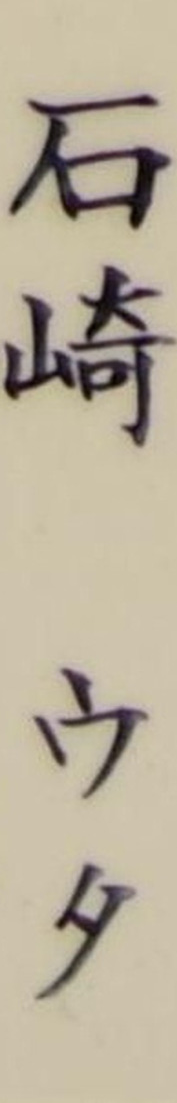石崎ウタ
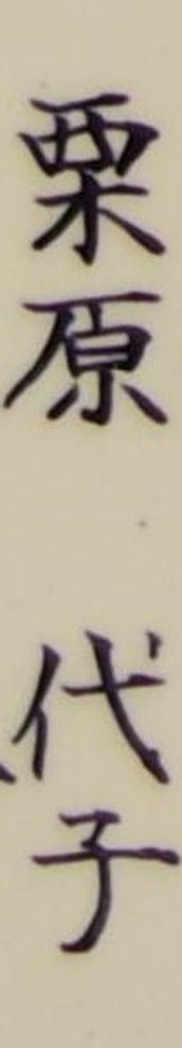栗原代子
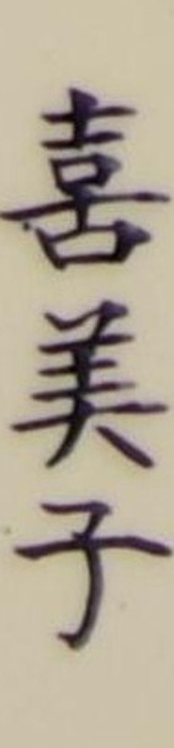喜美子
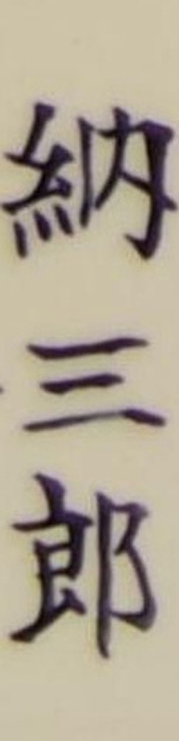納三郎
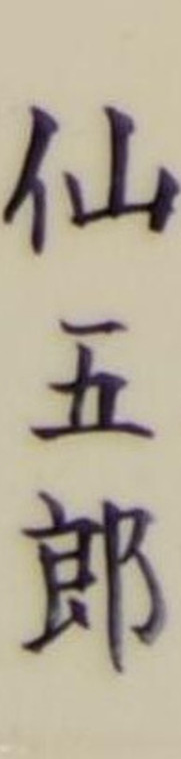仙五郎

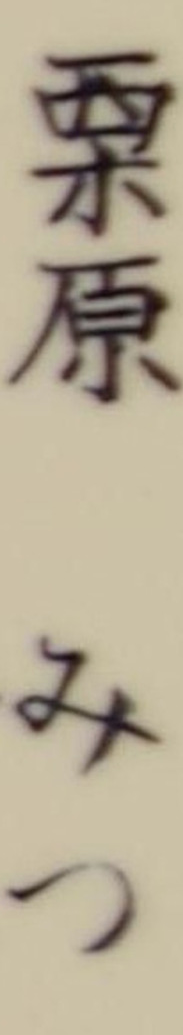栗原みつ
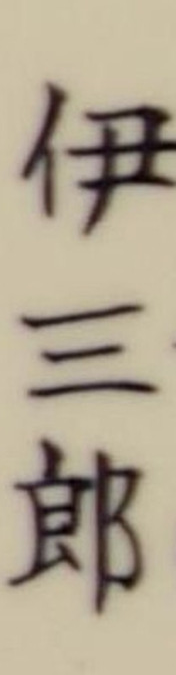伊三郎
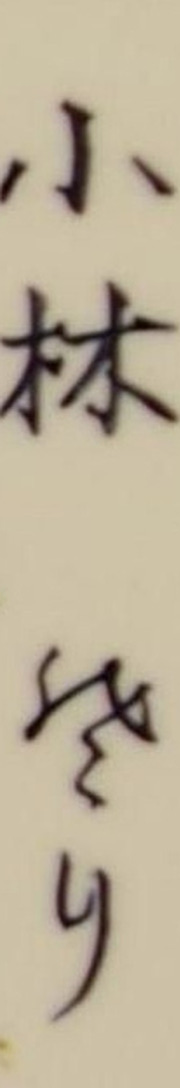小林そり
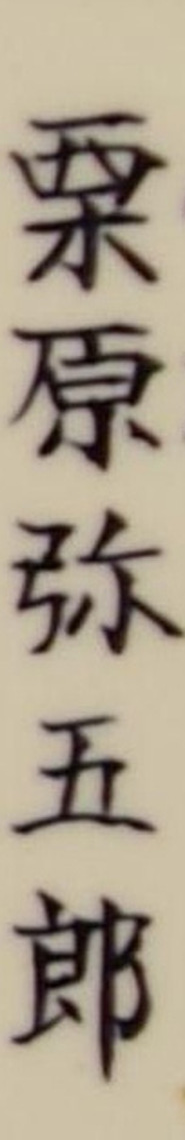栗原弥五郎
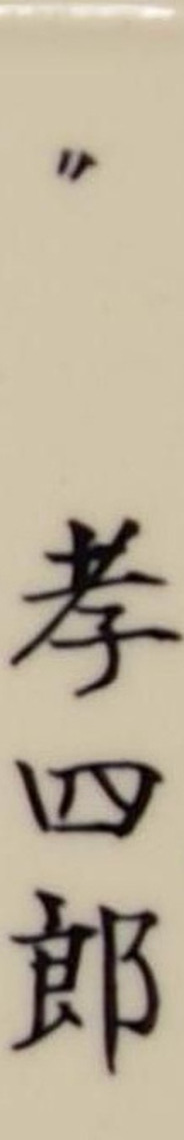孝四郎
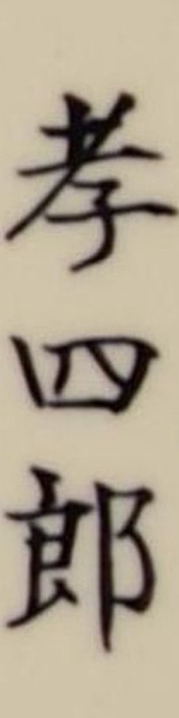孝四郎
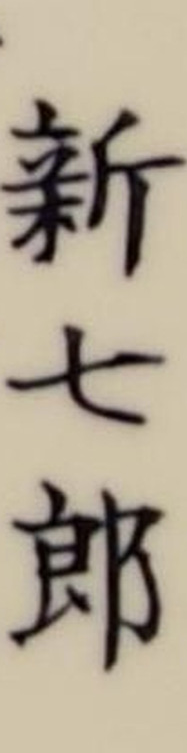新七郎
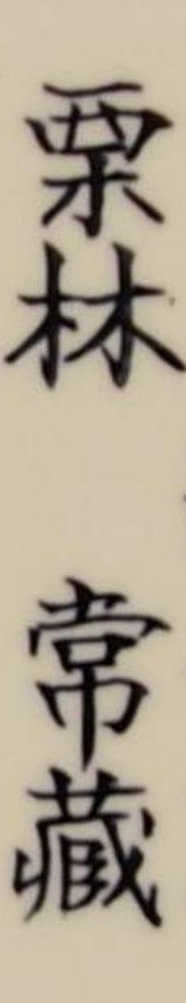栗林常蔵
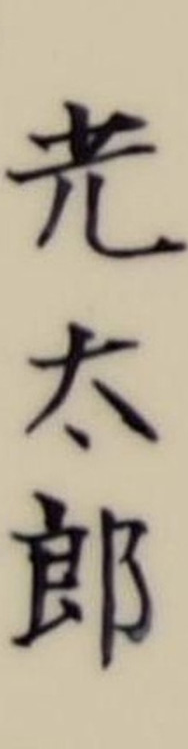光太郎
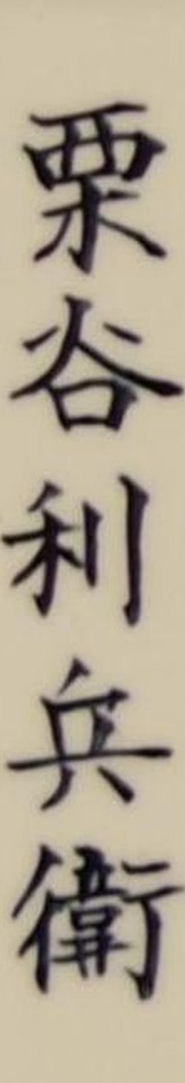栗谷利兵衛
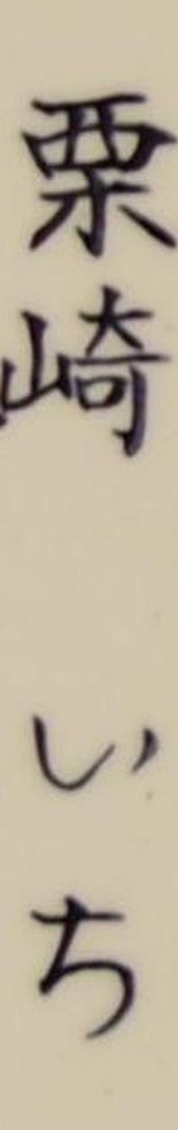栗崎いち
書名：A~D
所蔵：koyasan kongobuji
